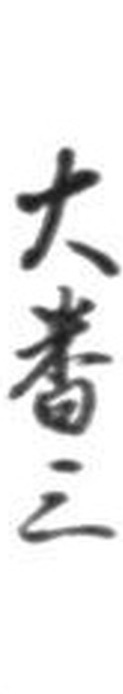大番三
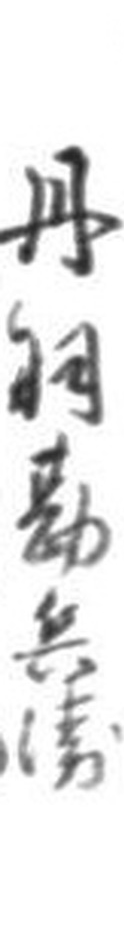丹羽勘兵衛
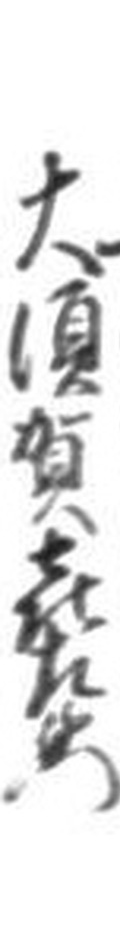大須賀喜左衛門
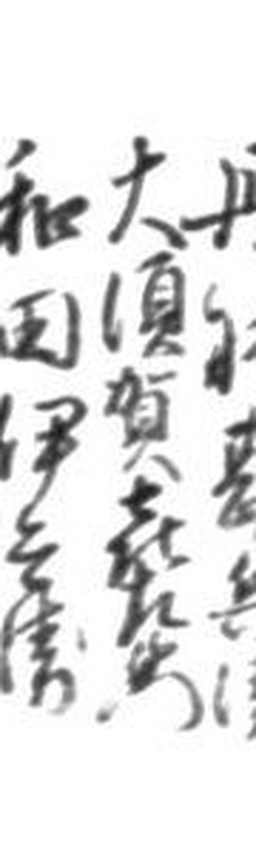和田伊兵衛
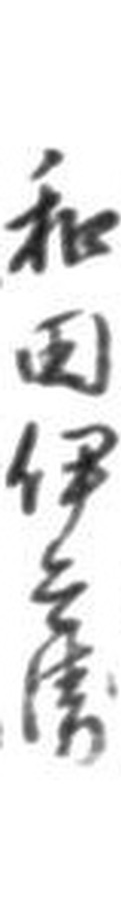和田伊兵衛
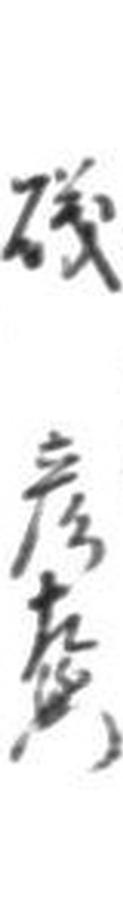磯彦左衛門
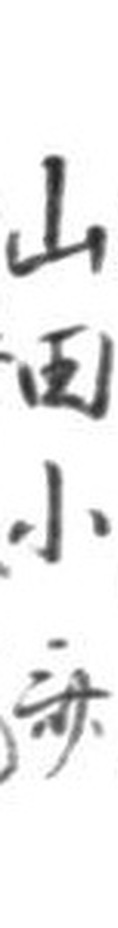山田小斎
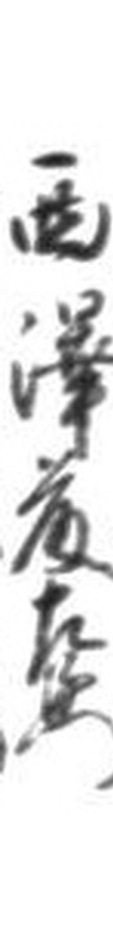西沢藤左衛門
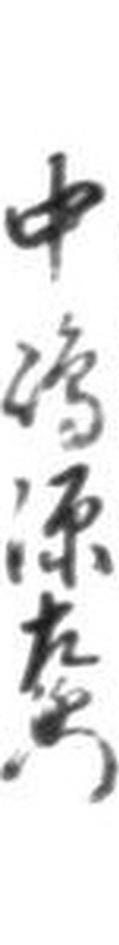中嶋源左衛門
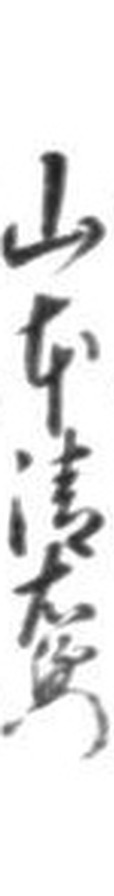山本清右衛門
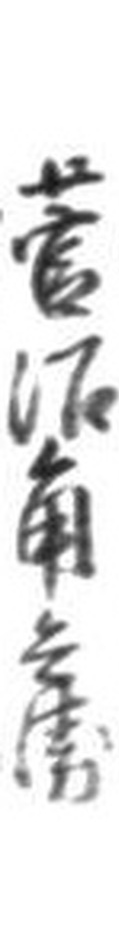菅沼角兵衛
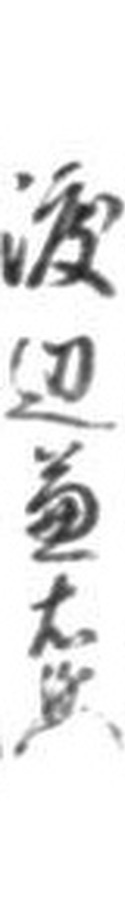渡辺兼右衛門
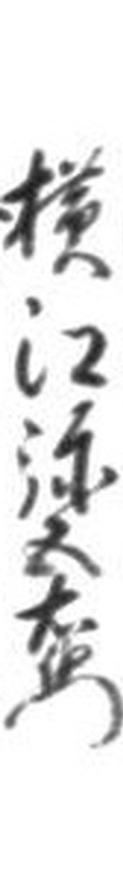横江弥五右衛門
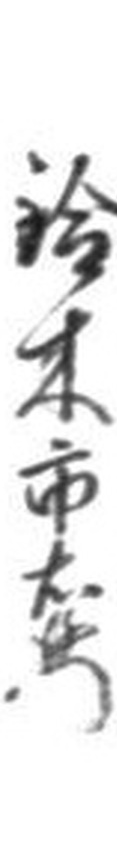鈴木市右衛門

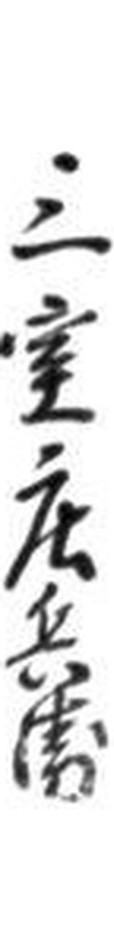三室庄兵衛
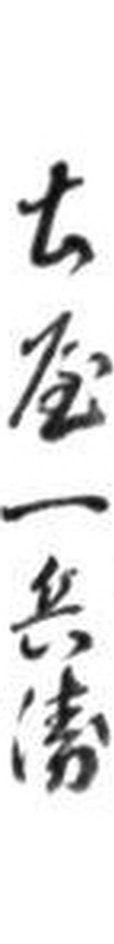土屋一兵衛
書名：家譜 二 忠直公 従文禄四年到慶安四年
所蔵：福井県文書館 Fukui Prefectural Archives
